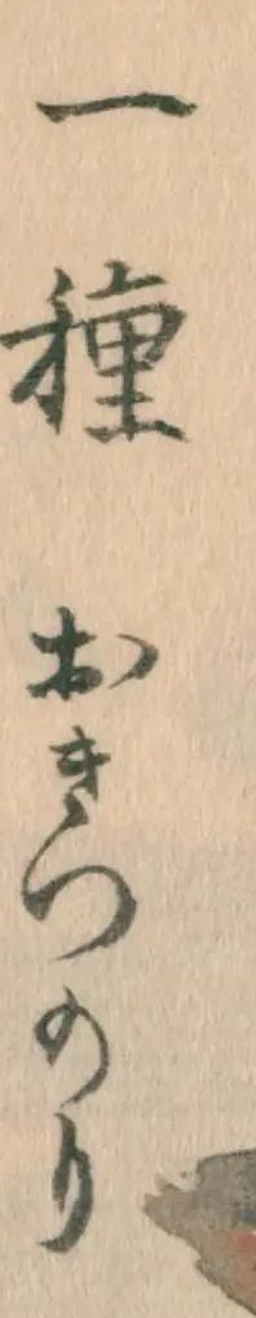一種おきつのり
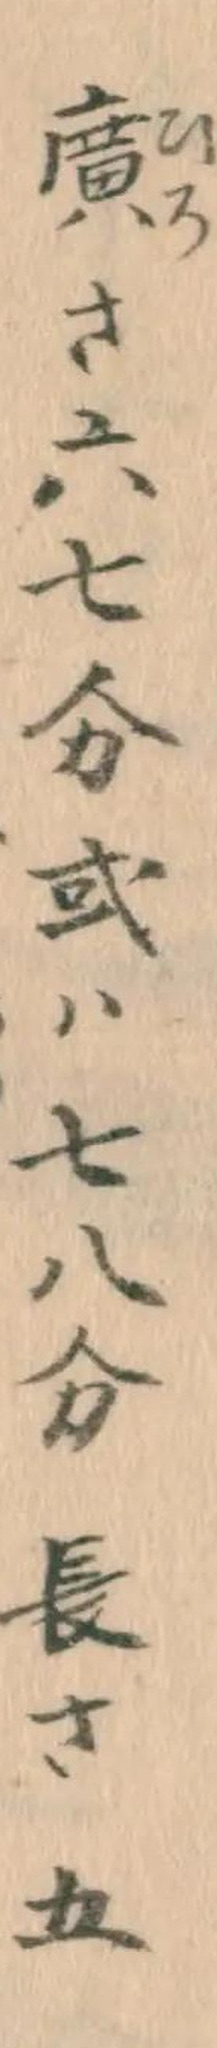広さ六七分或は七八分長さ五
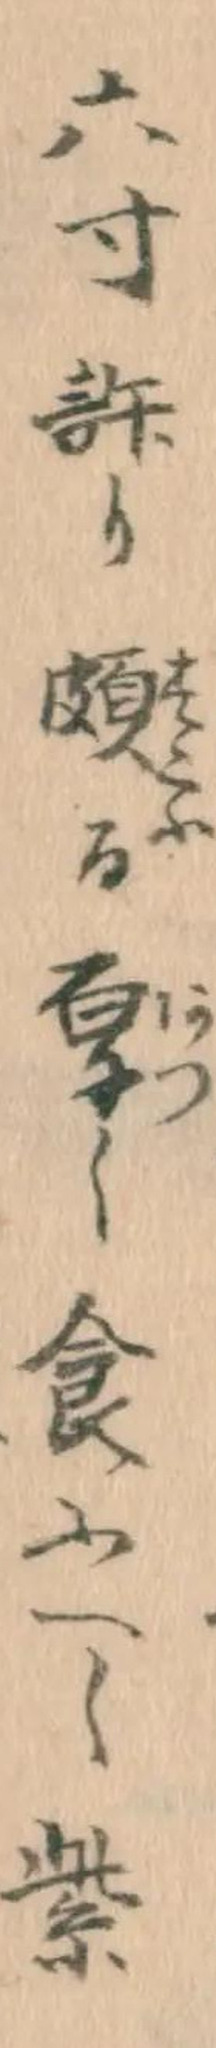六寸許り頗る厚し食ふへし紫
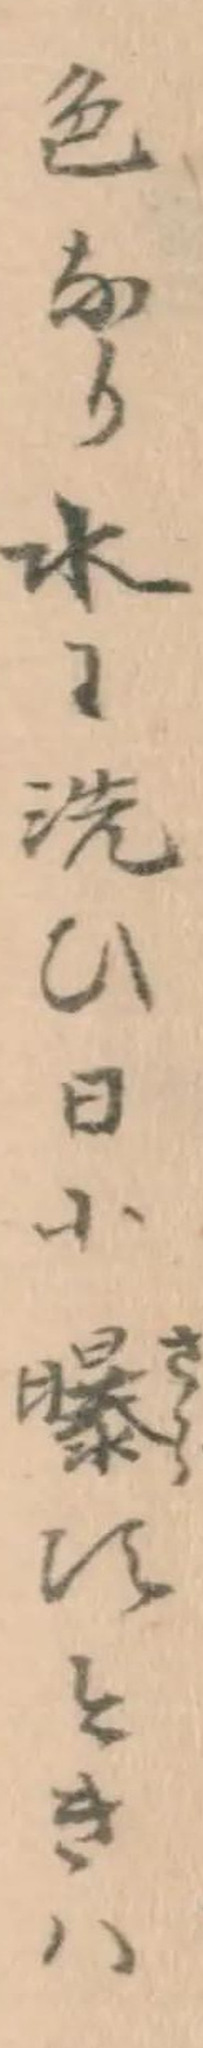色なり水に洗ひ日に曝すときは
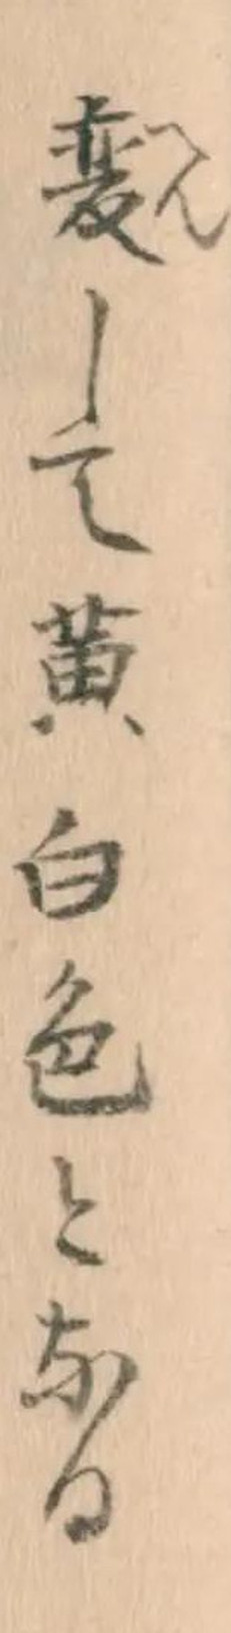変して黄白色となる

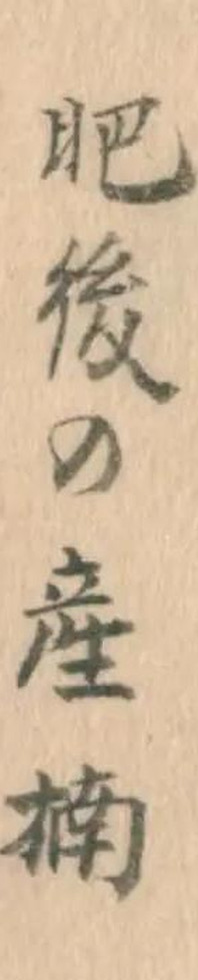肥後の産楠
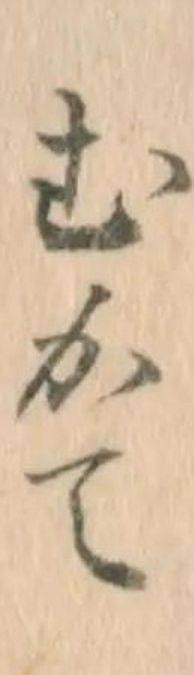むかて
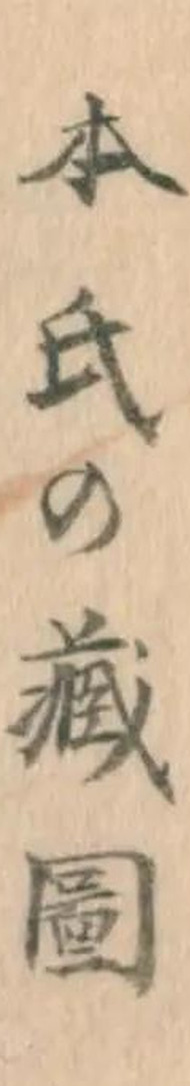本氏の蔵図
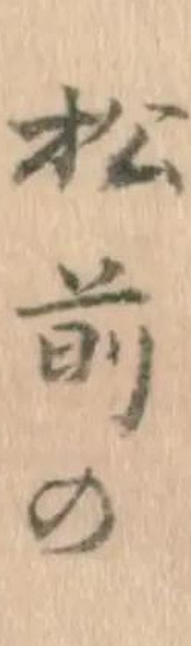松前の
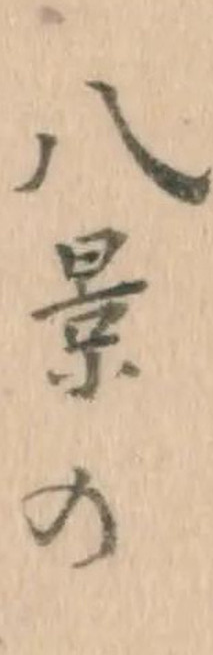八景の
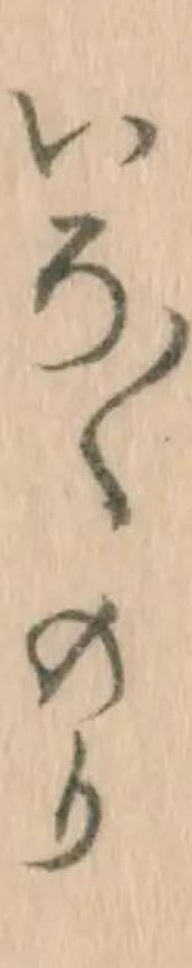いろ〳〵のり
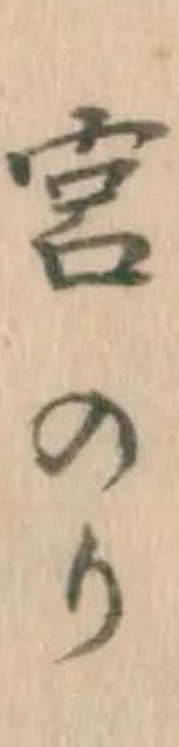宮のり
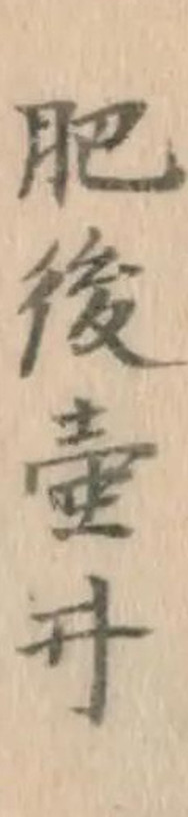肥後壺井
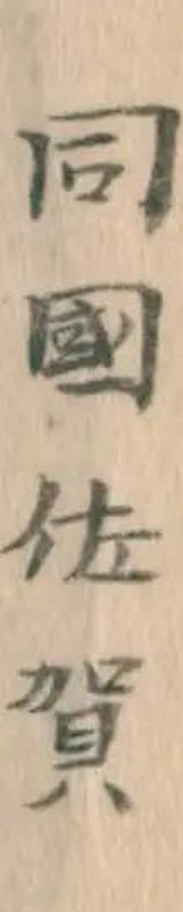同国佐賀
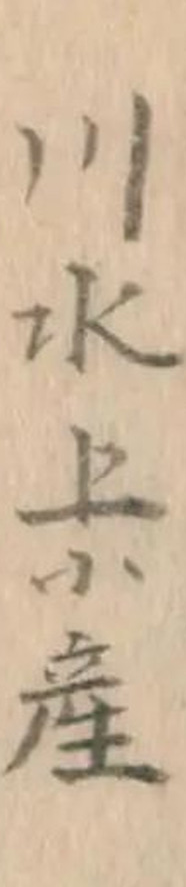川水上に産
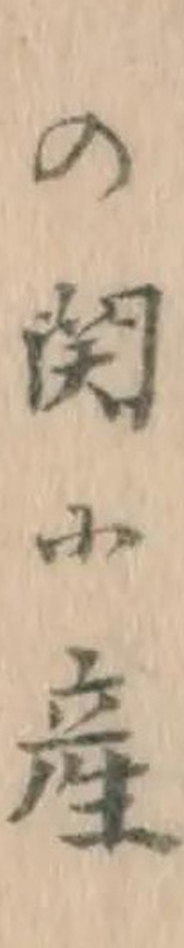の関に産
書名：本草図譜. 巻52-54
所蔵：国立国会図書館 National Diet Library, JAPAN
